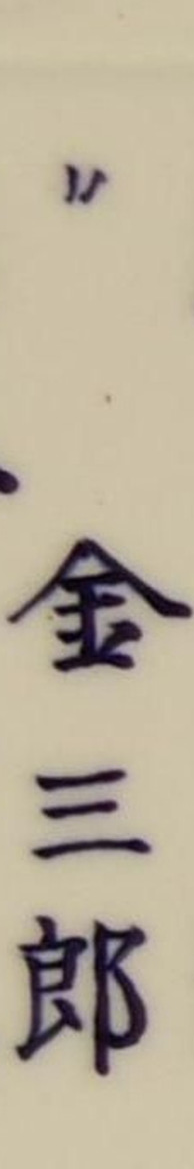金三郎
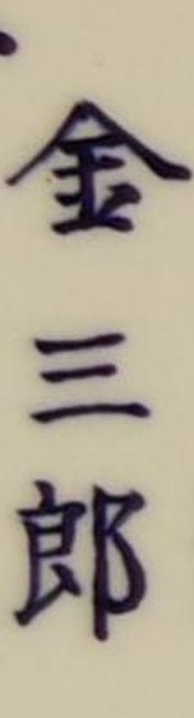金三郎
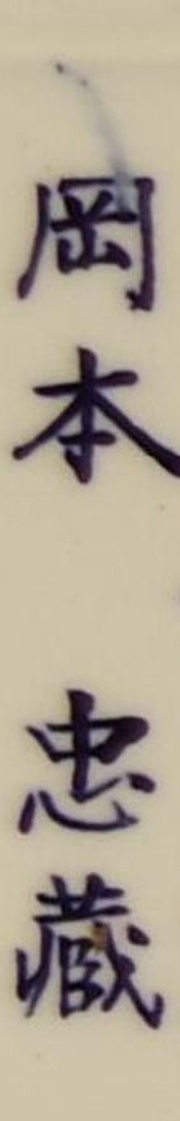岡本忠蔵
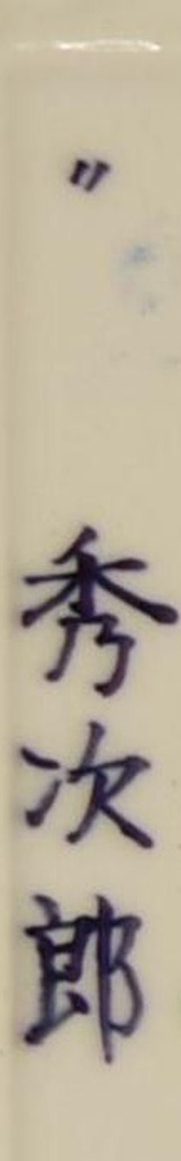秀次郎
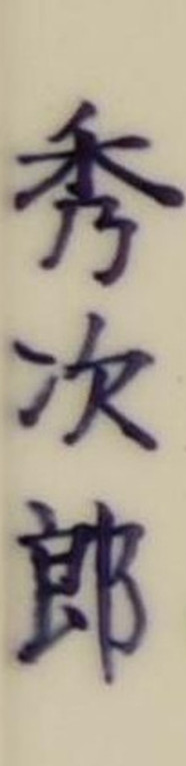秀次郎

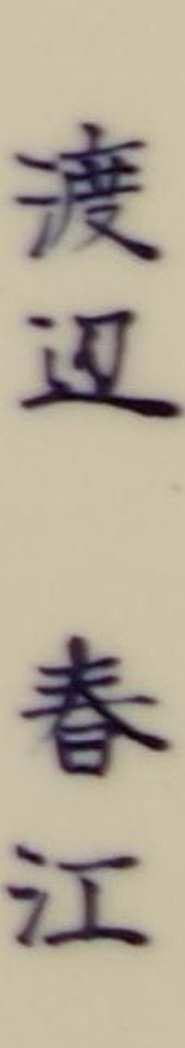渡辺春江
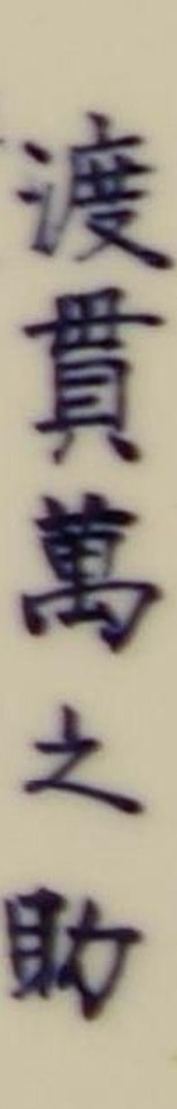渡貫萬之助
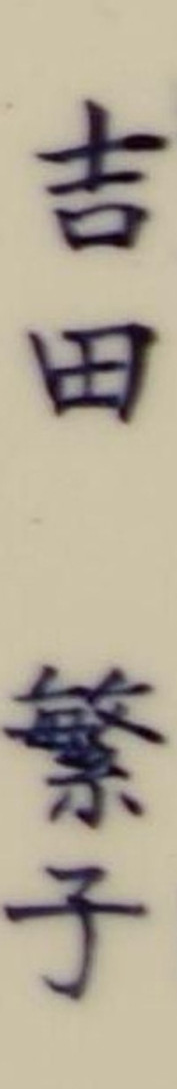吉田繁子
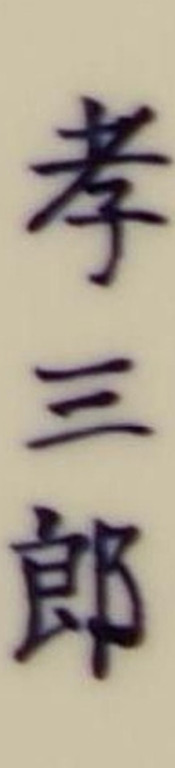孝三郎
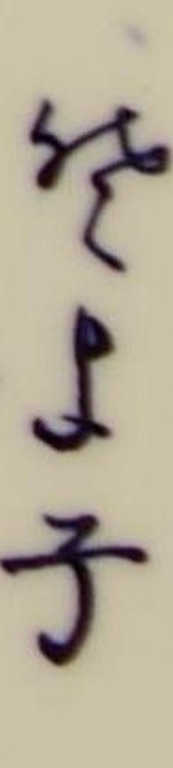そよ子
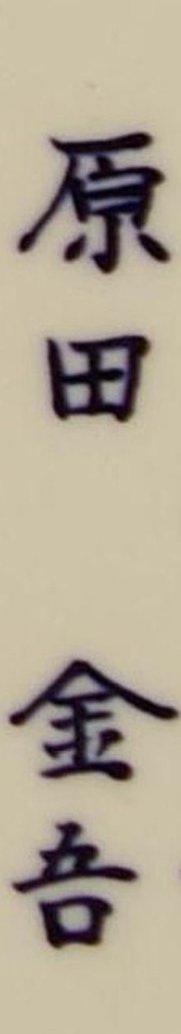原田金吾
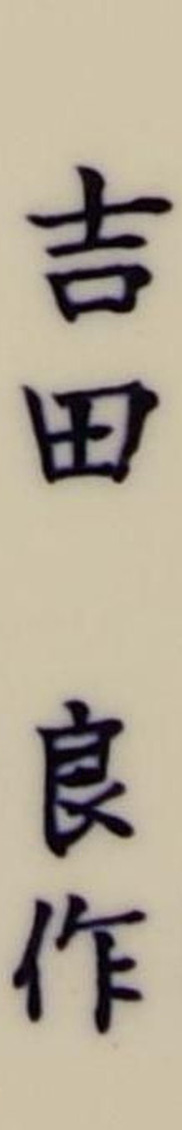吉田良作
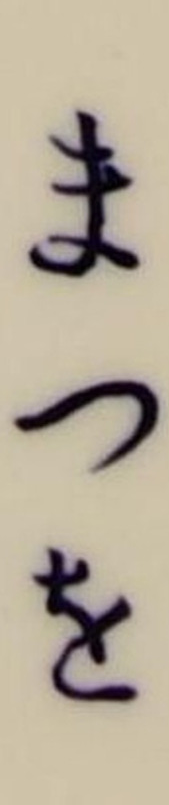まつを
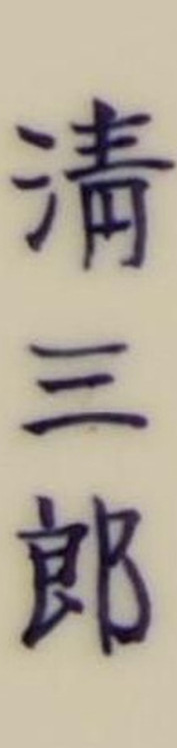清三郎

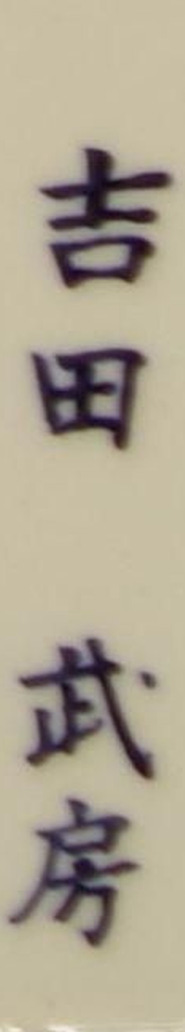吉田武房
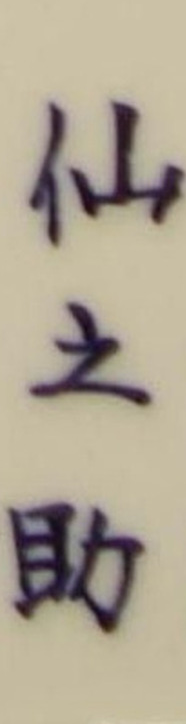仙之助
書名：E~L
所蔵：高野山金剛峯寺
